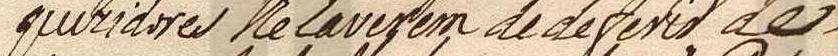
quizidores lhe haverem de deferir, de
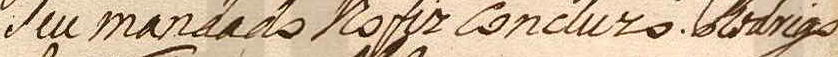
seu mandado lho fiz concluzo. Rodrigo
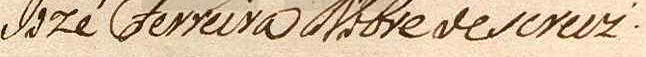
Iozé Ferreira Nobre o escrevi.
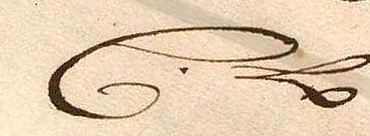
C.lo
